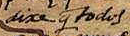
dixe q̄ todos
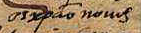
os xpão nouos
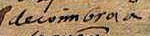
de coimbra a
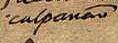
culpauaõ
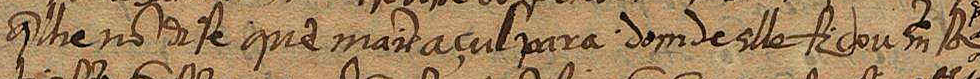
q̄ lhe nō dise quē mais a culpara domde Elle ficou mto sa
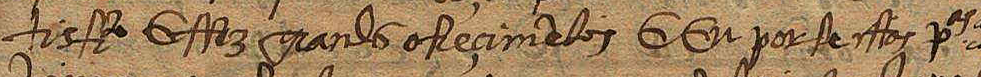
tisfcto E ffez grandes ofreçimētos E Eu por se estas pas.
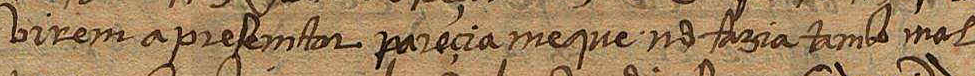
virem apresemtar pareçia me que nō fazia tamto mal
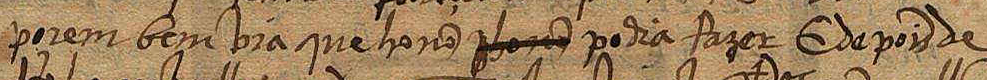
porem bem via que ho nō herão podia fazer E depois de
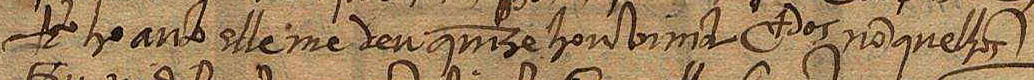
fcto ho auto Elle me deu quīze hou vimte Ctdos nō que lhos
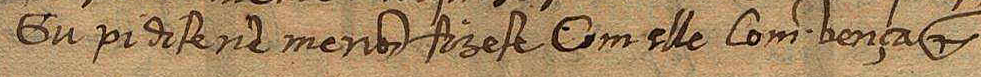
Eu pidise nē menos fizese Com Elle Comvença c̄ꝭ
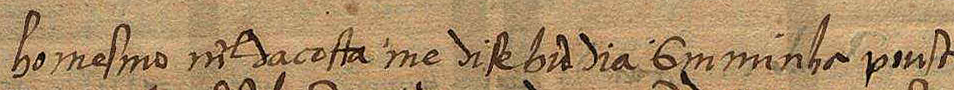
ho mesmo mel da costa me dise hū dia Em minha pousa
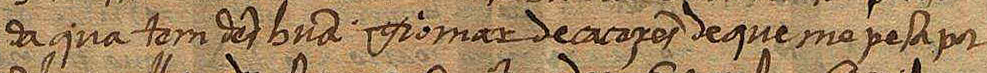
da qua temdes huā giomar de caçares̄ de que me pesa por
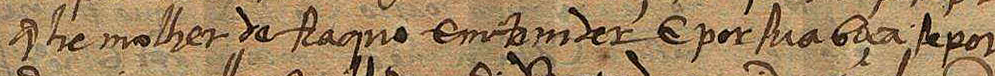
q̄ he molher de fraquo Emtemder E por sua boca se per
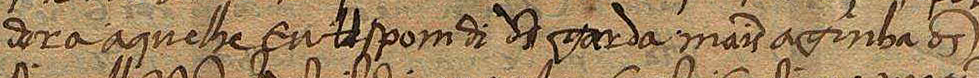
dera a que lhe Eu Respomdi ds̄ garda mais aginha os
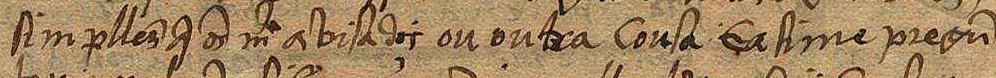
simplles q̄ os mto avisados ou outra Cousa E asi me pregū
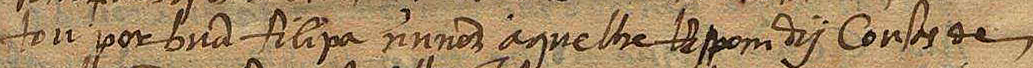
tou por huā filipa nunez̄ a que lhe Repomdij Cousas de
